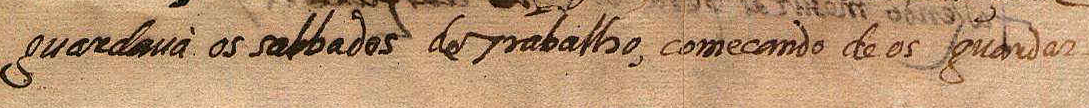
guardaua os sabbados de trabalho, começando de os guardar
